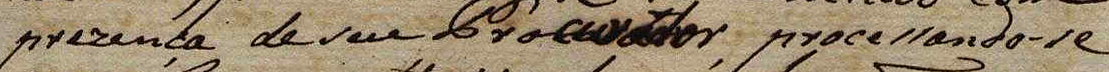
prezença de seu Procurador, processando-se
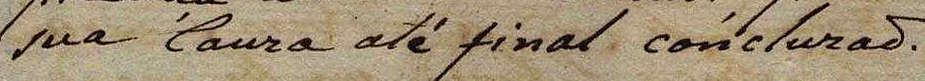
sua Cauza até final concluzaõ.
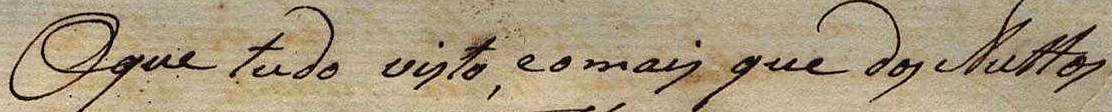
O que tudo visto, e o mais que dos Auttos
